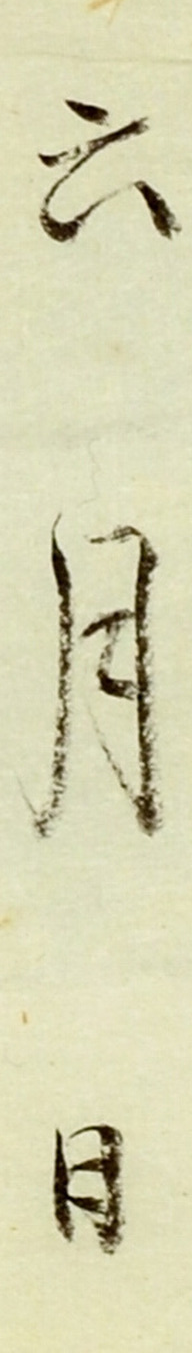六月日
